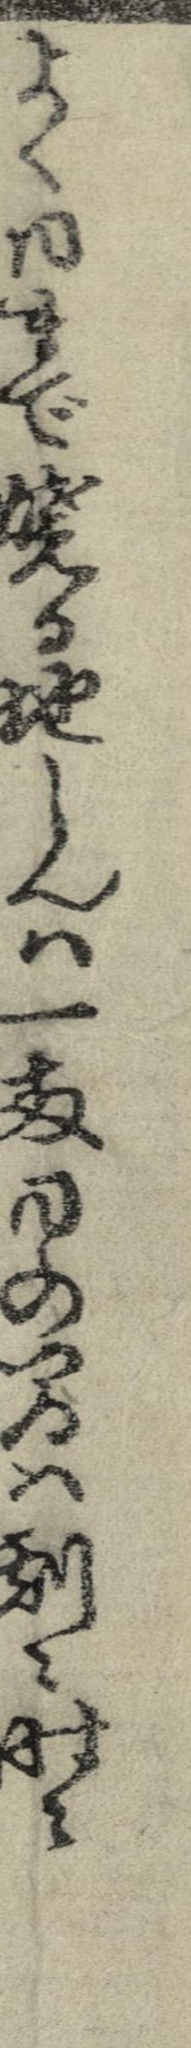よく日まで焼る地しんハ一両日の間ハ刻々時々
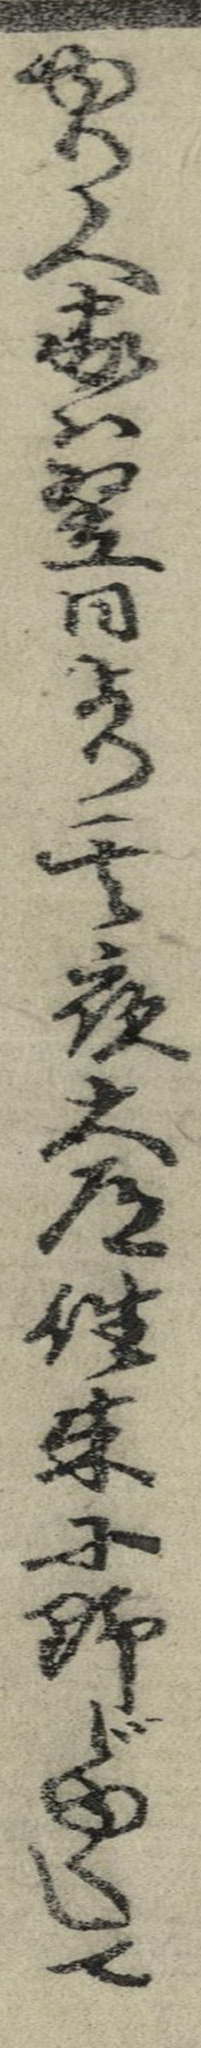ゆり人家ハ翌日より其夜大道往来に野じゅくして
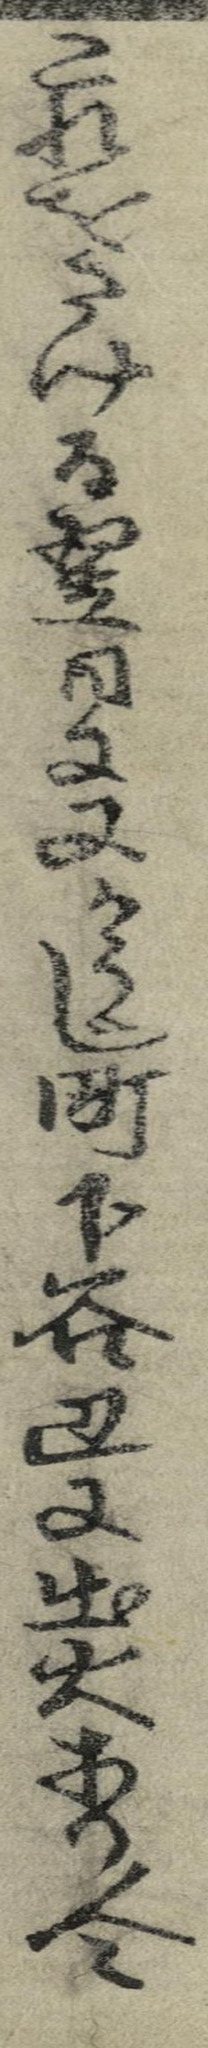これをさける翌日又又かうじ町下谷辺に出火あり人々小塚原
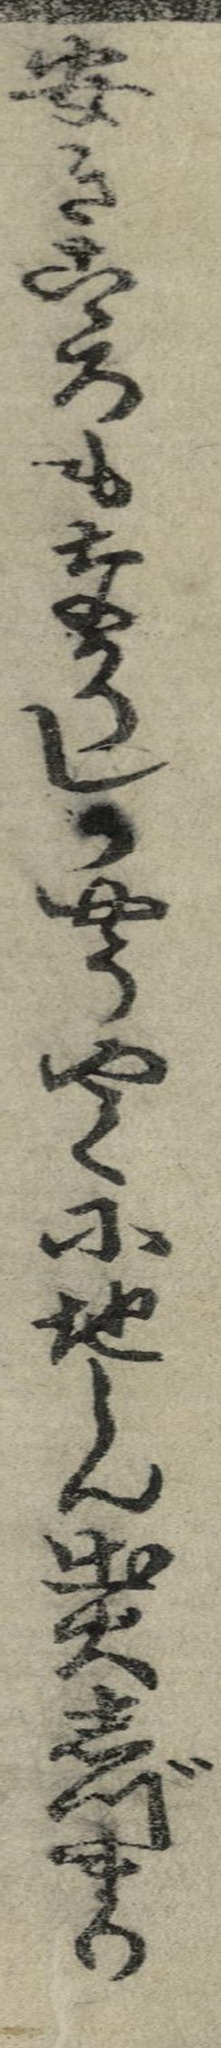安きここゝろもなかりしがやうやくに地しん出火しづまり千住
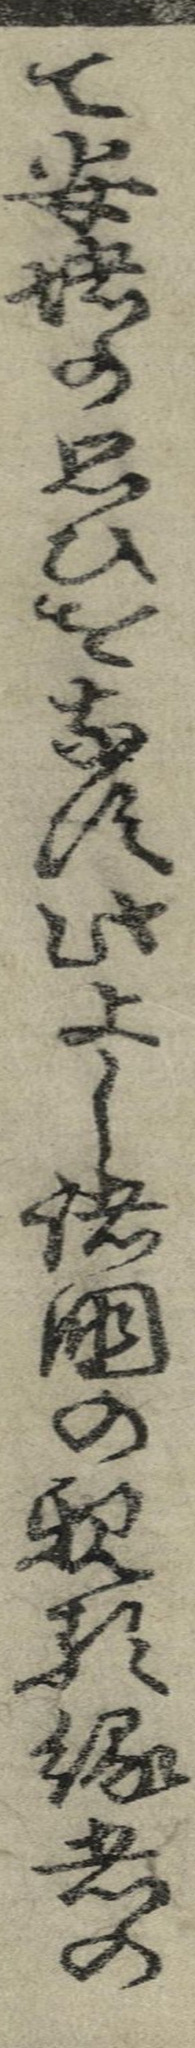て安堵の思ひをなす此よし諸国の親類縁者の
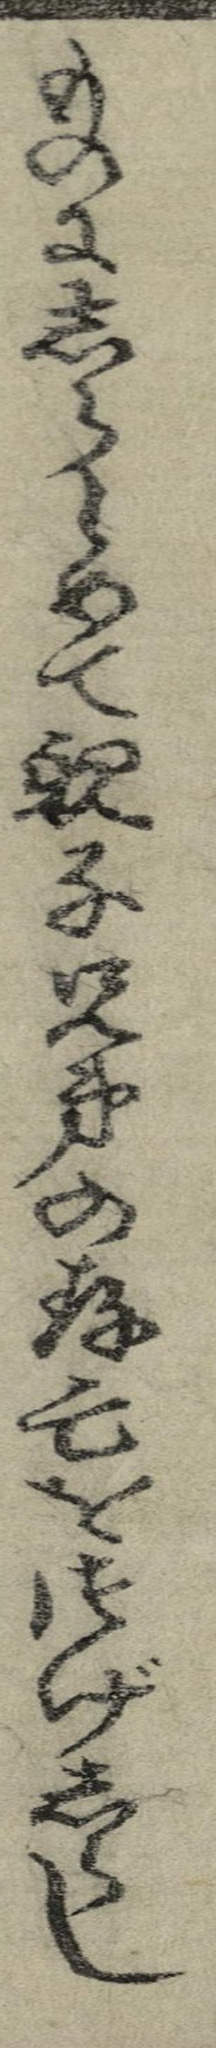ものにしらしめて親子兄弟の存亡をとげしらし
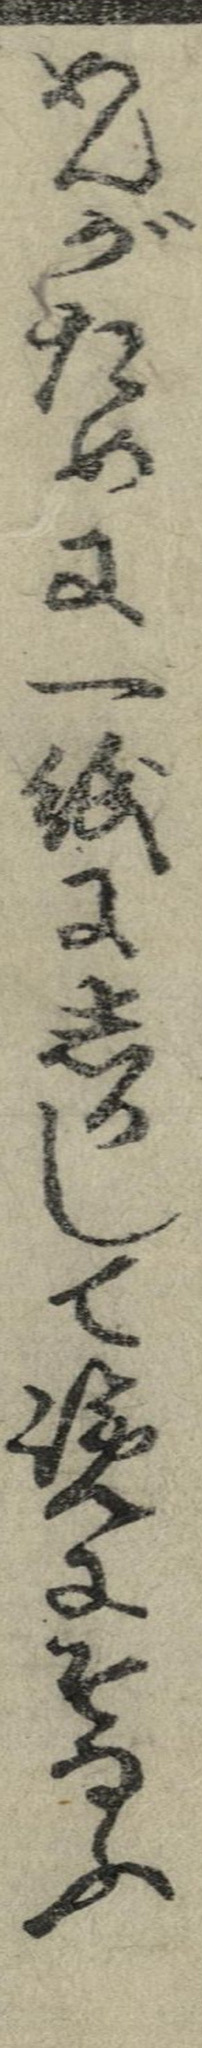めんがために又一紙にしるして覧にそなふ
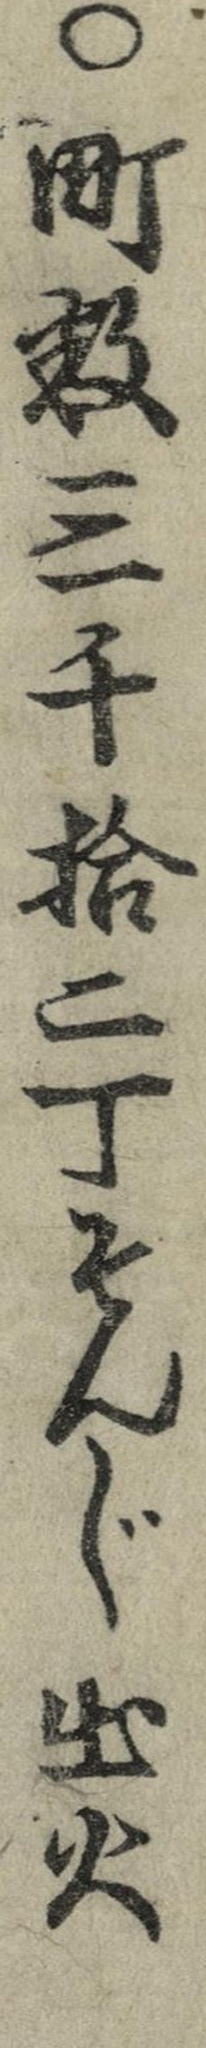〇町数三千拾二丁そんじ出火
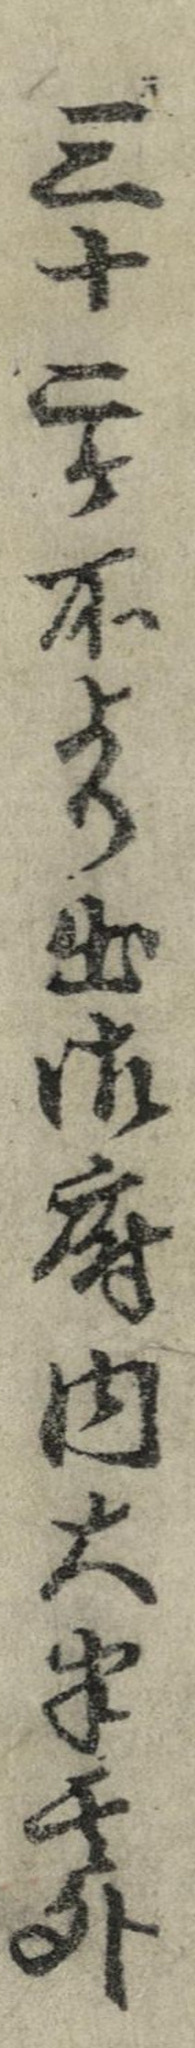三十二ケ所より出御府内大半其外
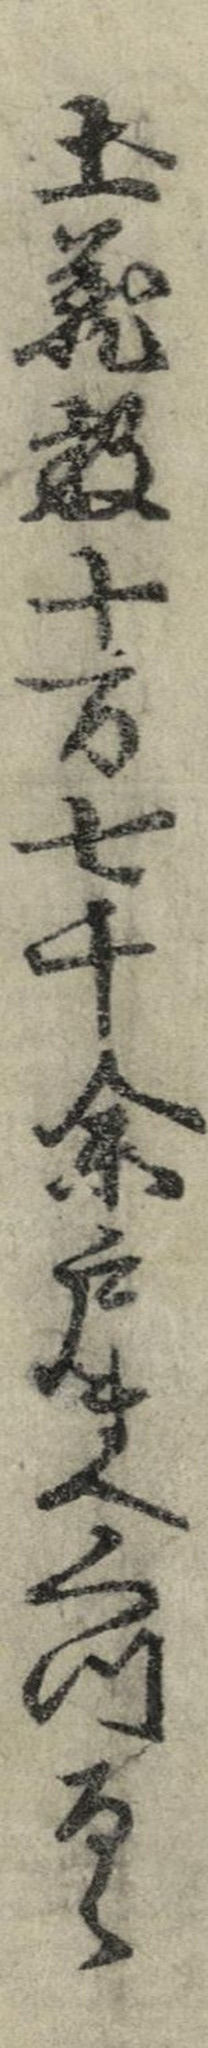土蔵数十万七千余戸まへくつるゝ
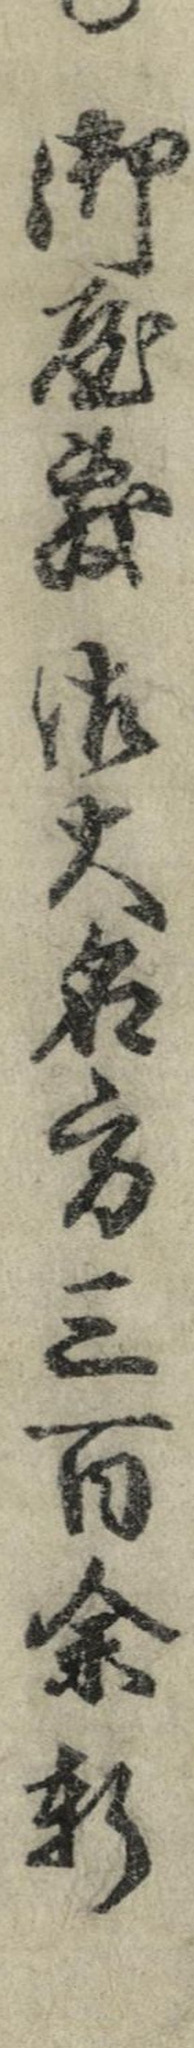〇御蔵屋敷御大名方三百余軒
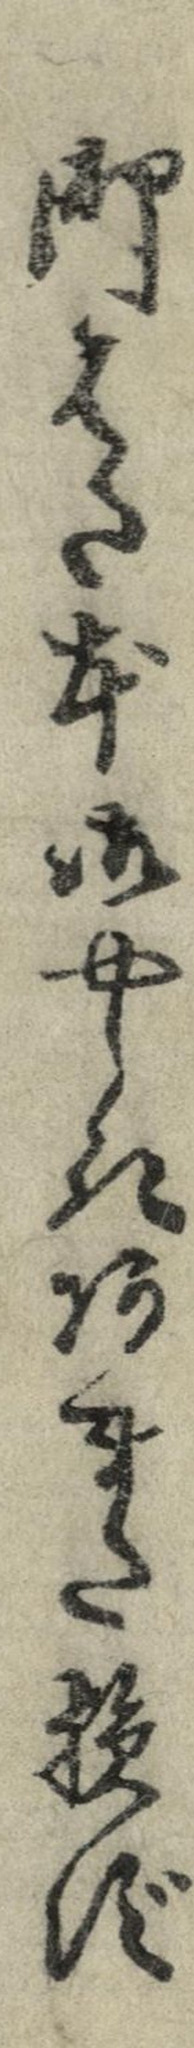御はた本御やきあまた損ず
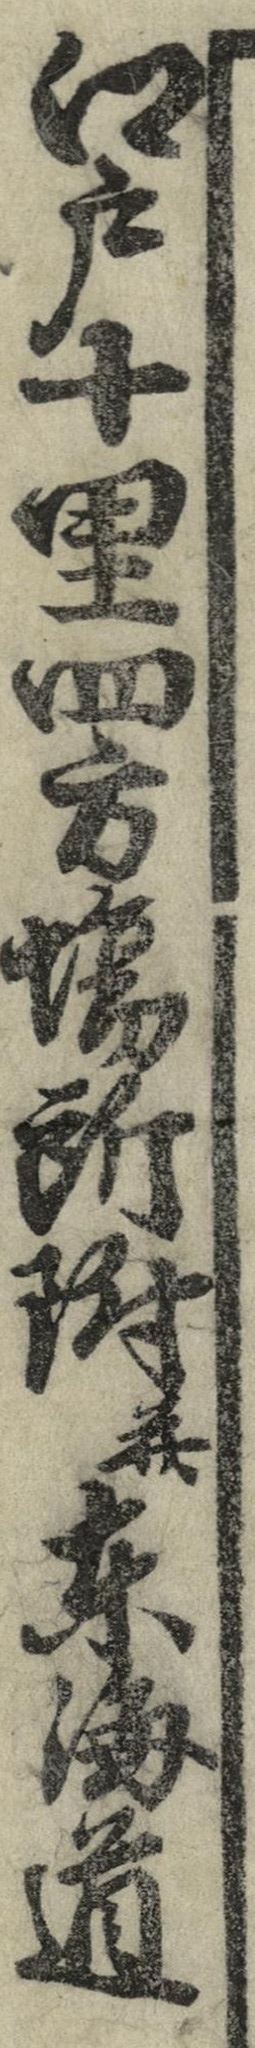江戸十里四方場所附幷東海道
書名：江戸大地震并出火場所極本しらべ
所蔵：東京大学地震研究所図書室 Earthquake Research Institute Library, The University of Tokyo, JAPAN
